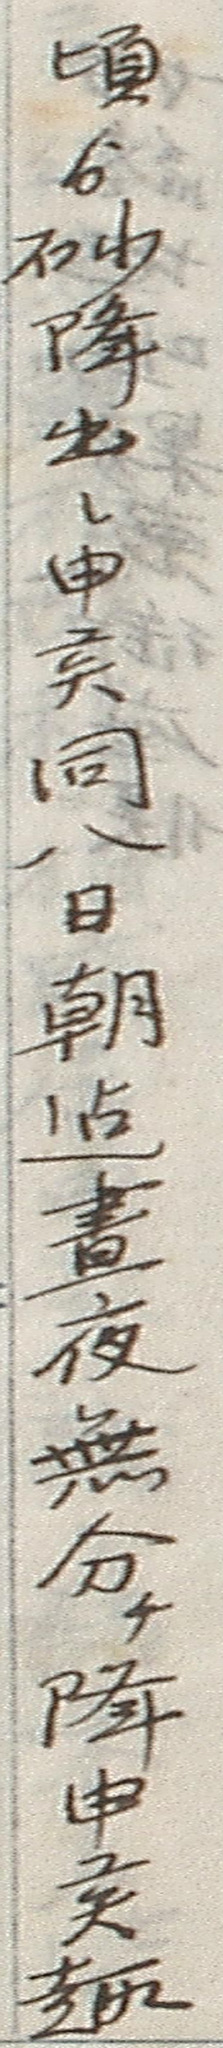頃ゟ砂降出し申候同八日朝迄晝夜無分チ降申候趣

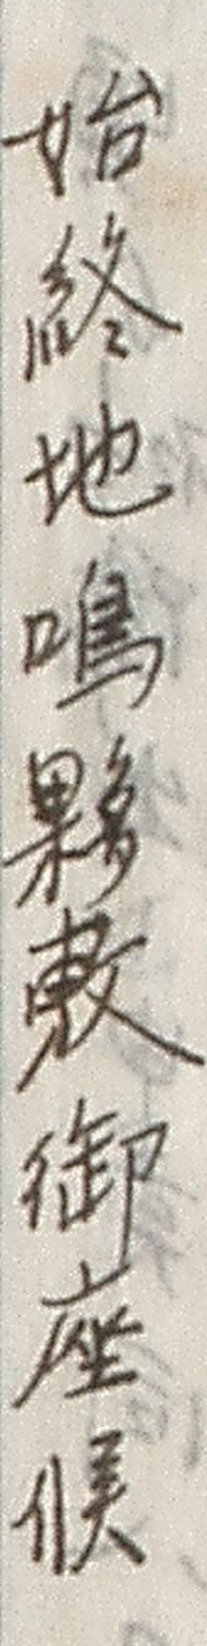始終地鳴夥敷御座候
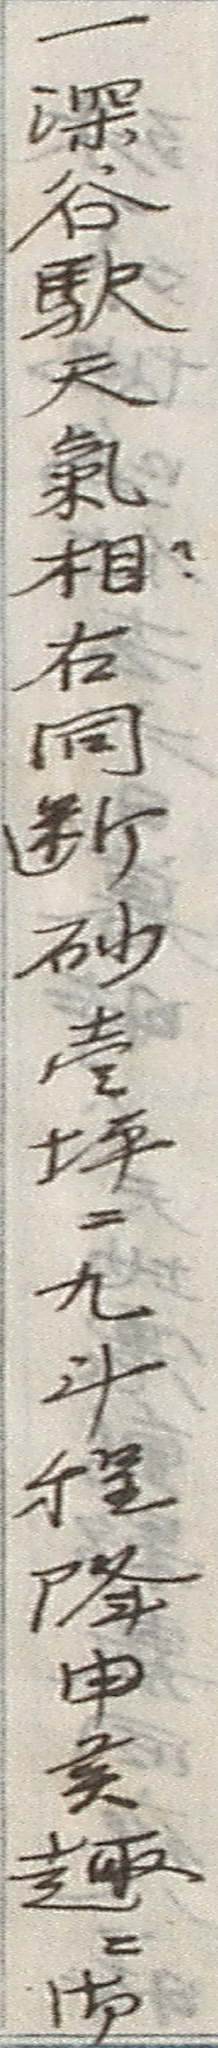一深谷駅天気相右同断砂壱坪二九斗程降申候趣二御
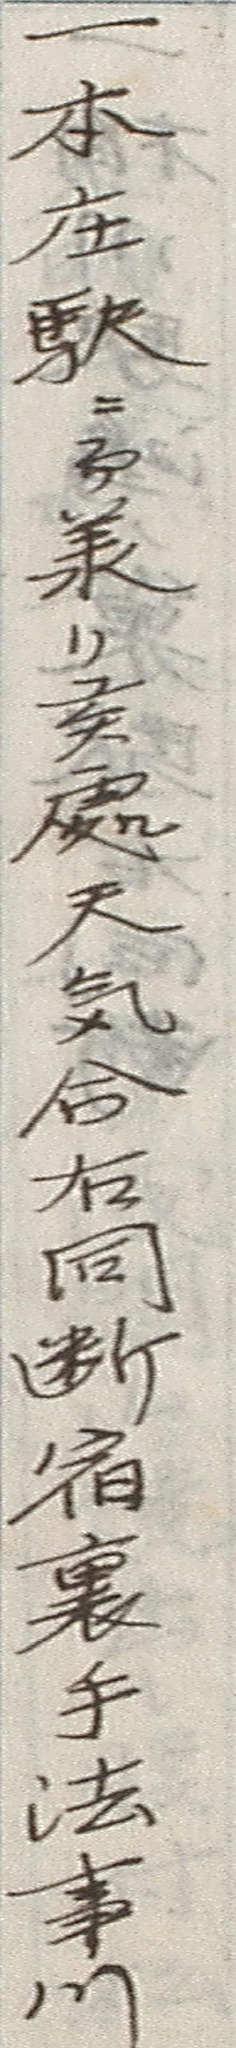一本庄駅二而承り候処天気合右同断宿裏手法事川
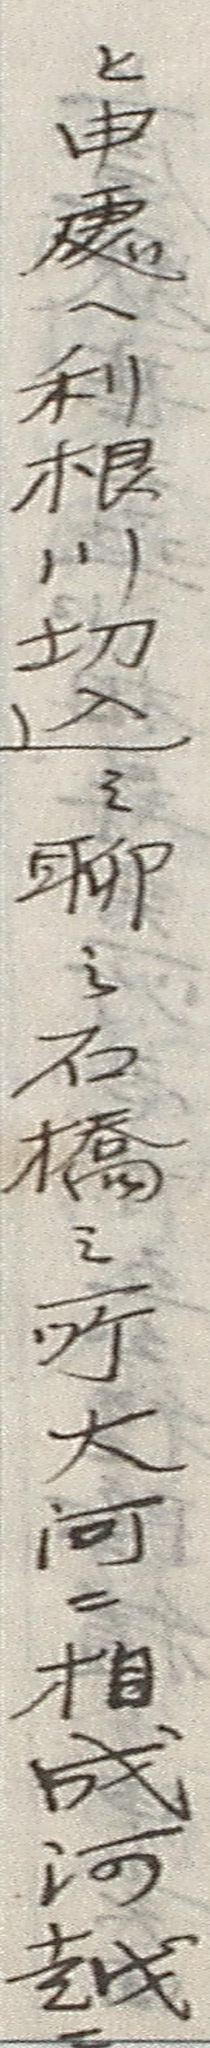と申処へ利根川切込ミ聊之石橋之一所大河二相成河越二
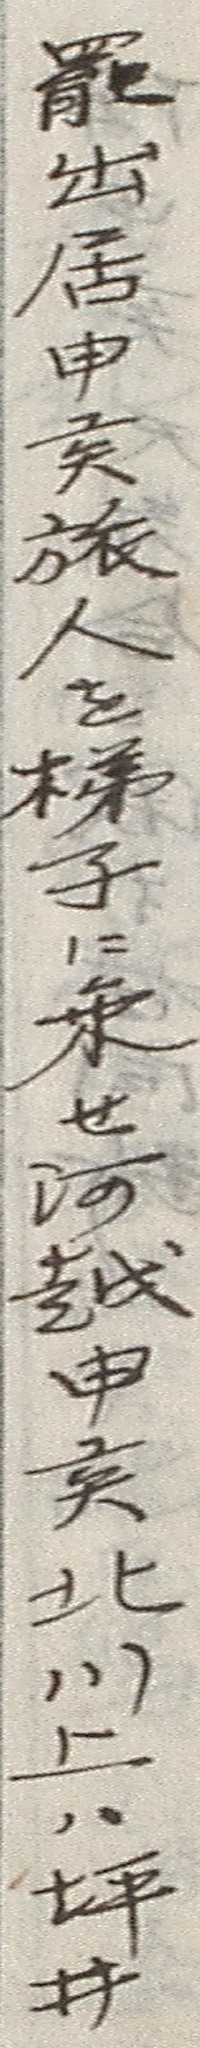罷出居申候旅人を梯子に乗せ河越申候北川上ハ坪井
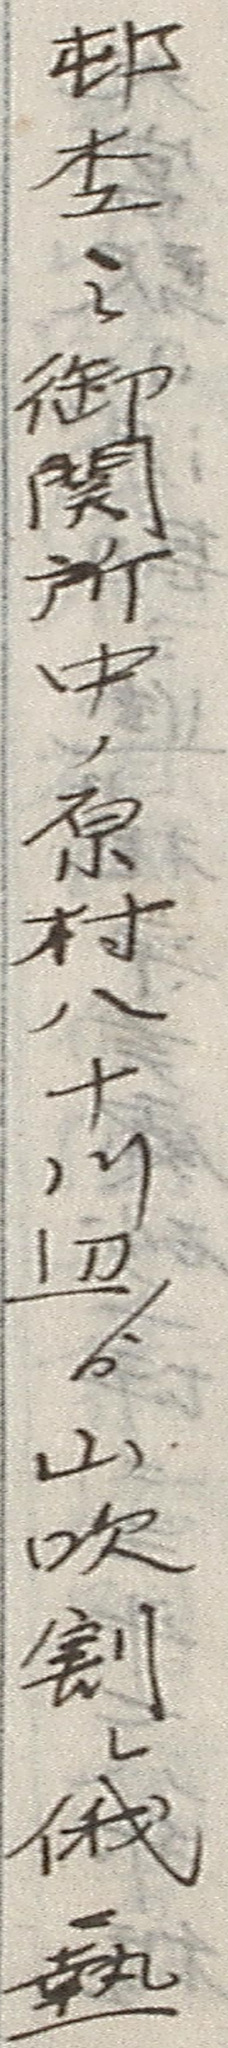邨杢之御関所中ノ原村八十川辺ゟ山吹割ㇾ俄二熱
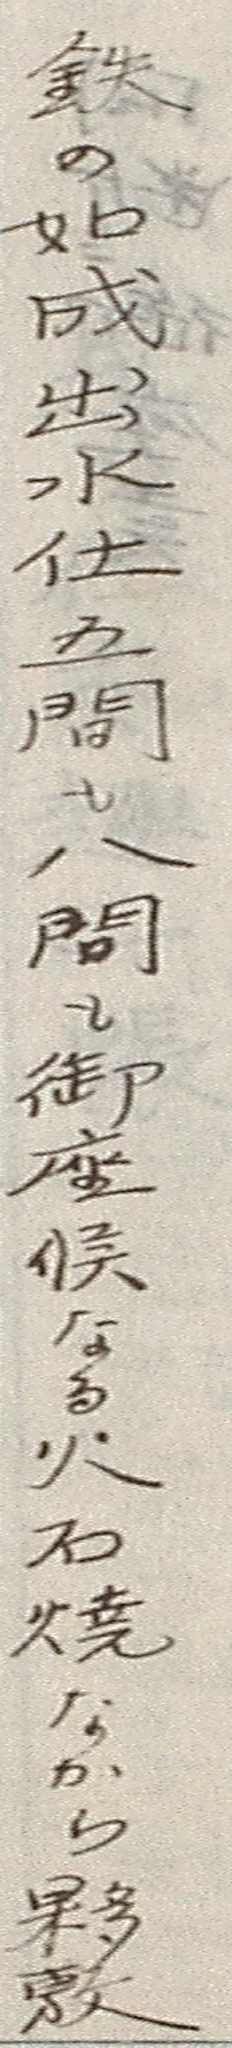鉄の如成出水仕五間も八間も御座候なる火石焼なから夥敷
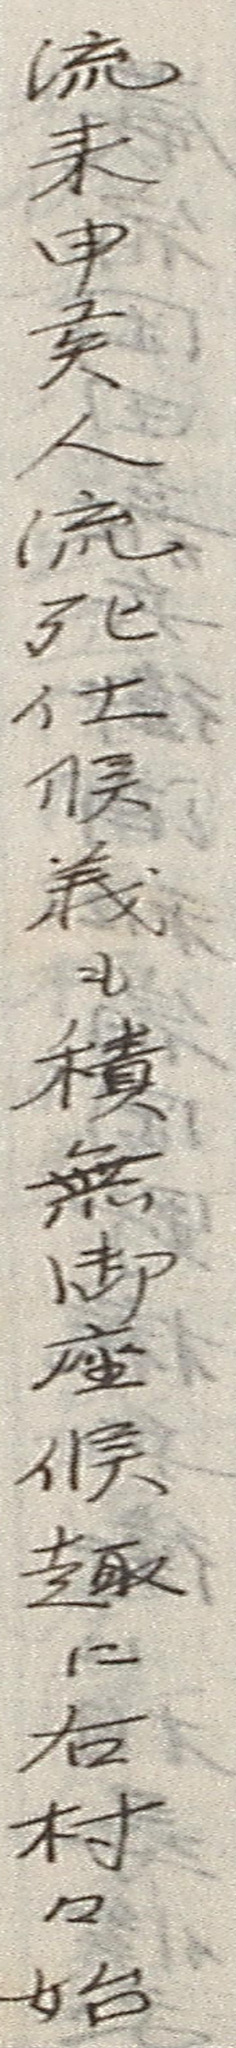流来申候人流死仕候義も積無御座候趣二右村々始
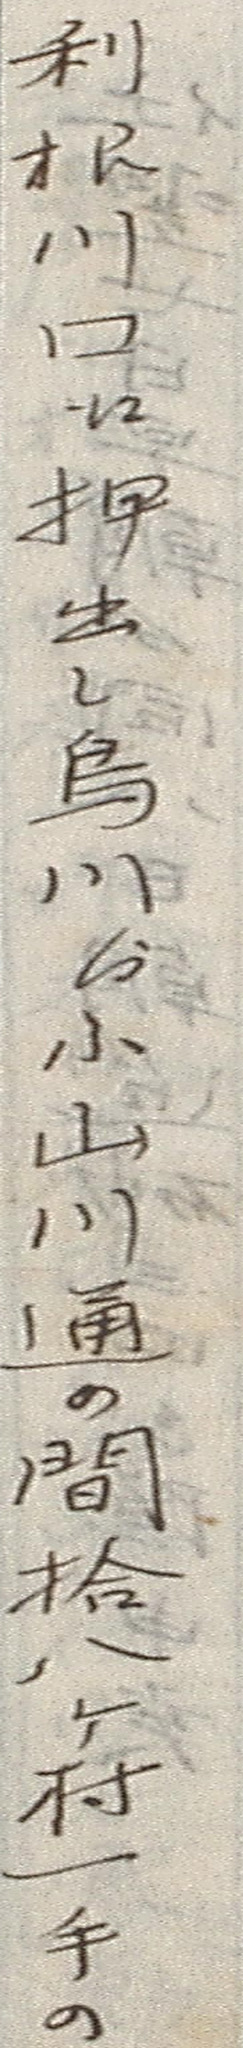利根川口江押出し烏川ゟ山川通の間拾八ヶ村一手の
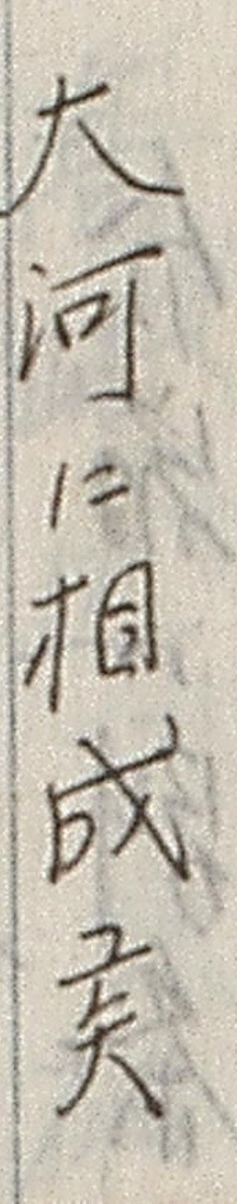大河に相成候
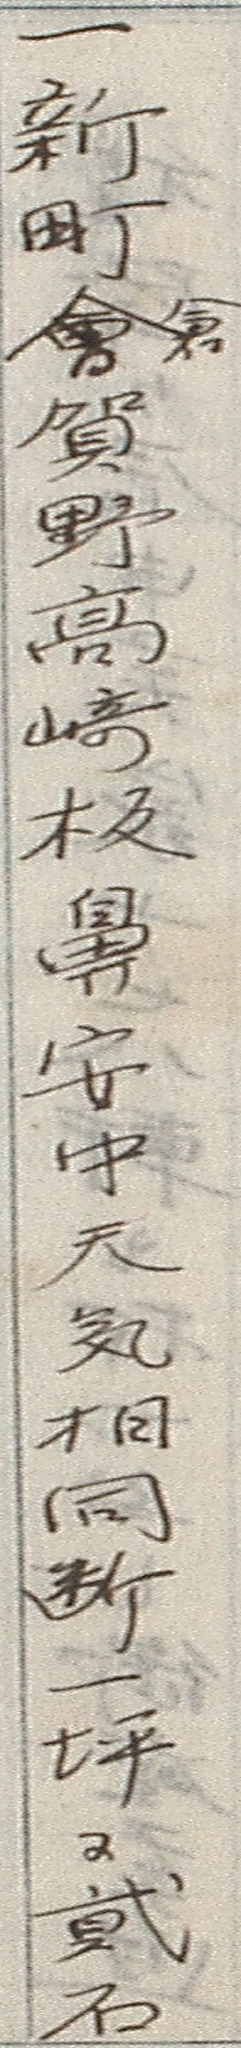一新町倉賀野高崎板鼻安中天気相同断一坪に弐石
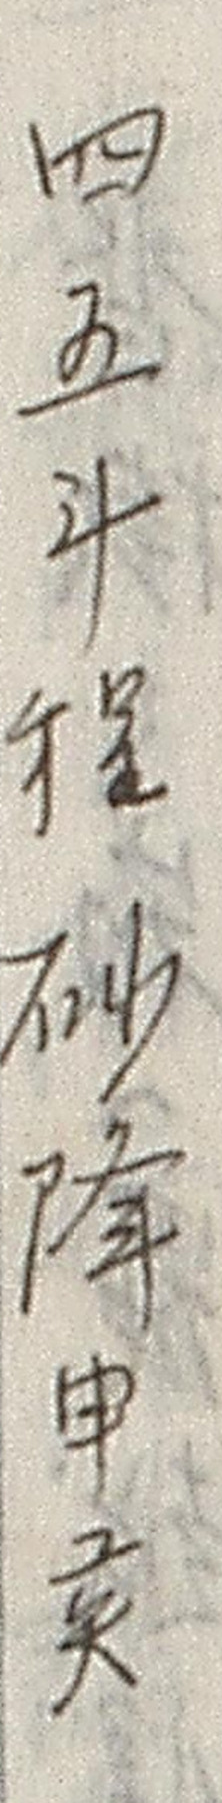四五斗程砂降申候
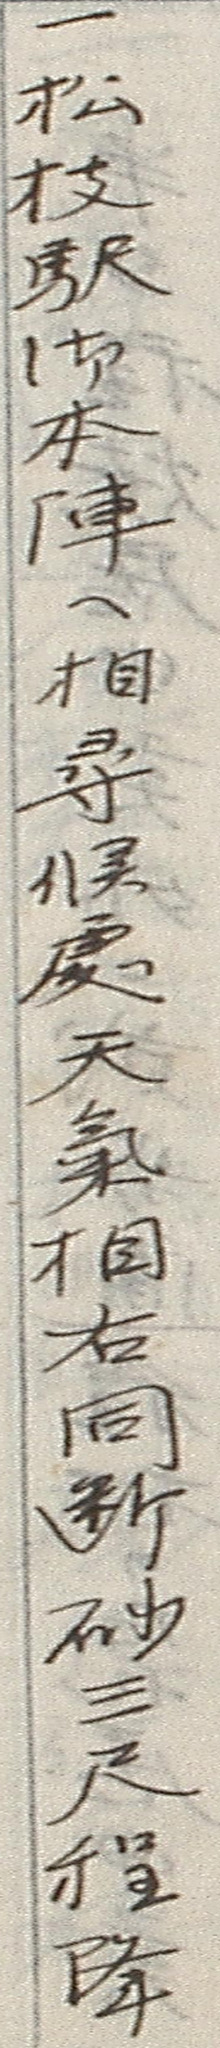一松枝駅御本陣へ相尋候処天気相右同断砂三尺程降
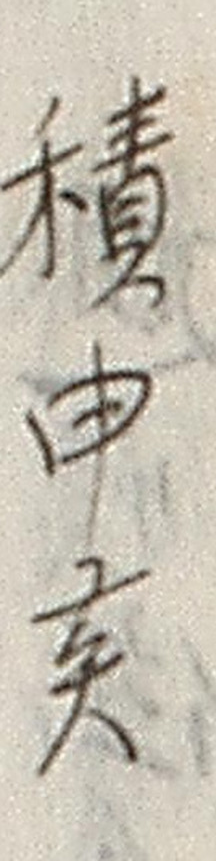積申候
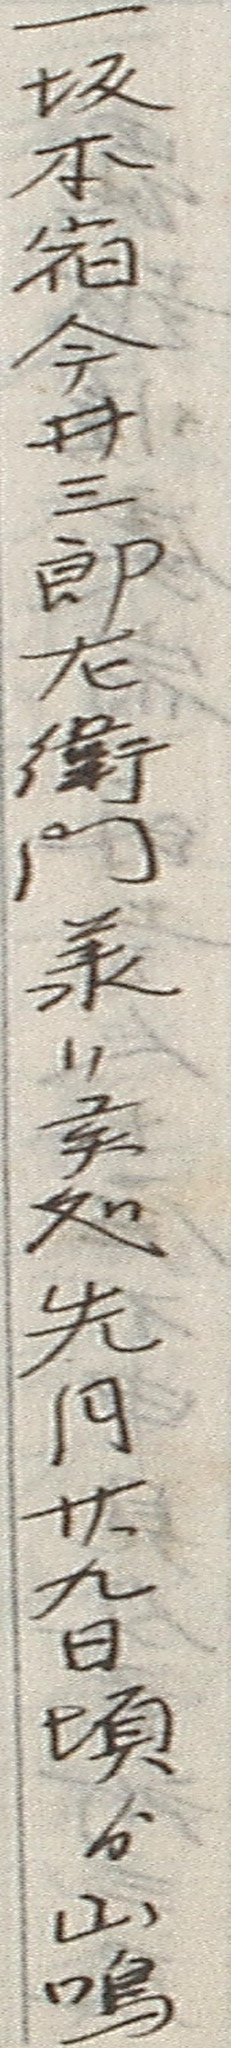一坂本宿今井三郎左衛門承り候処先月廿九日頃ゟ山鳴
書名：浅間山焼出記
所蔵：東京大学地震研究所図書室 Earthquake Research Institute Library, The University of Tokyo, JAPAN
